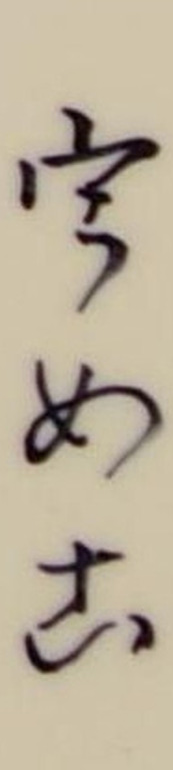うめこ
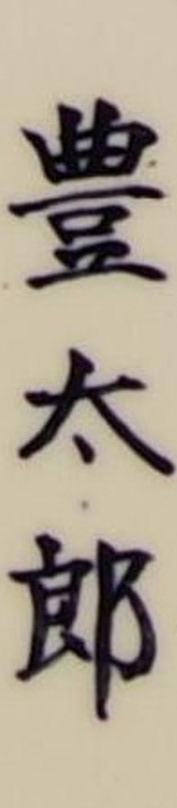豊太郎
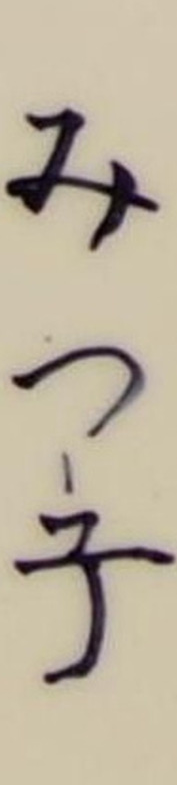みつ子
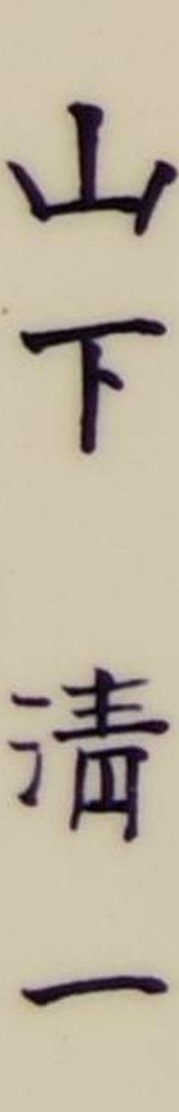山下清一
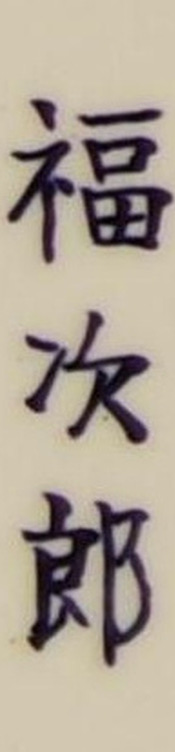福次郎
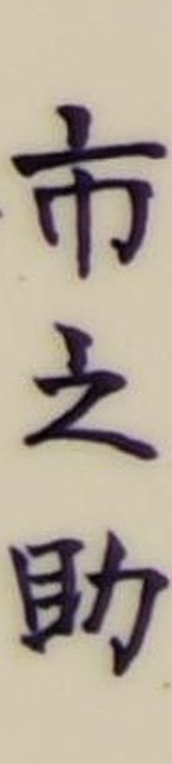市之助
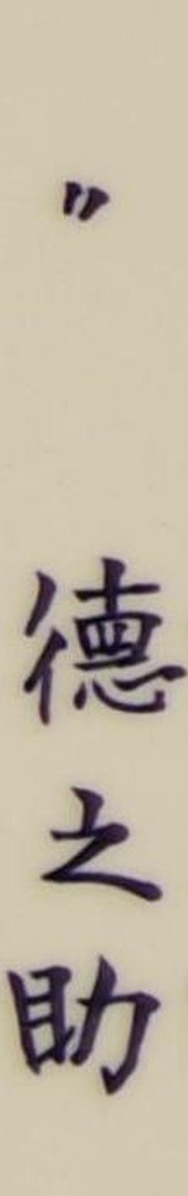徳之助
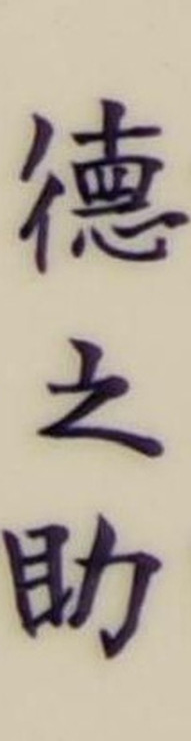徳之助
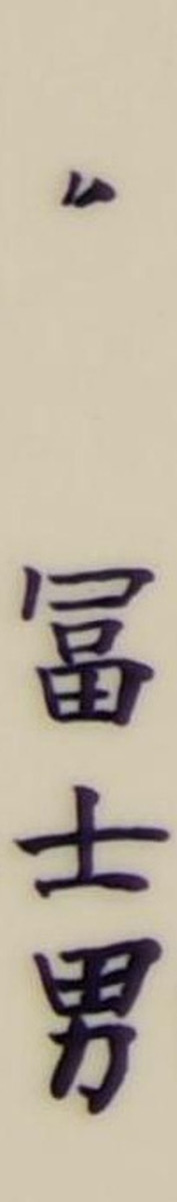冨士男
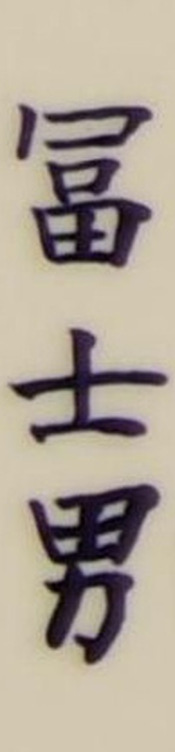冨士男
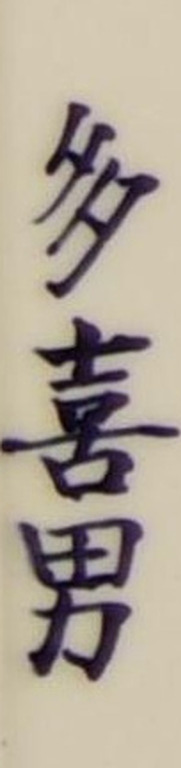多喜男

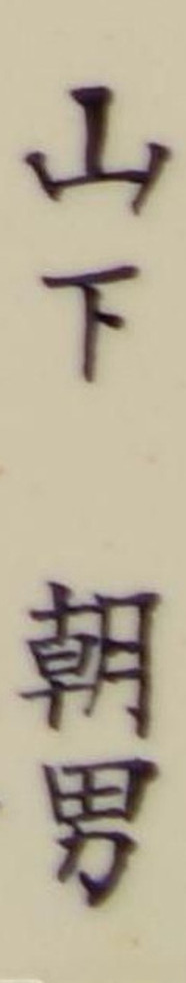山下朝男
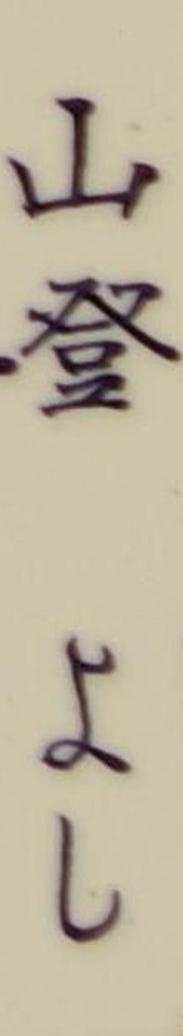山登よし
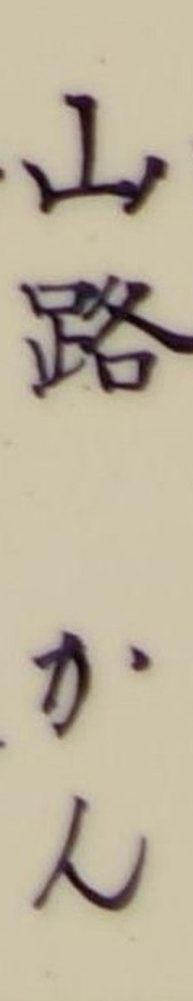山路かん
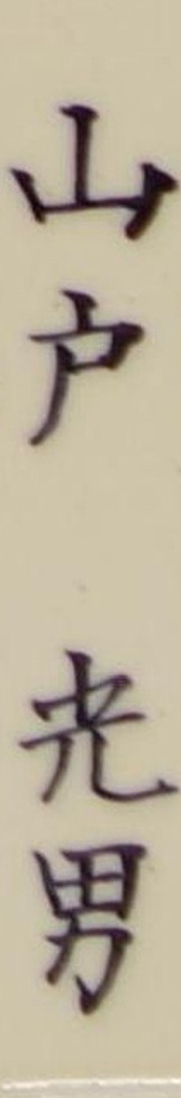山戸光男
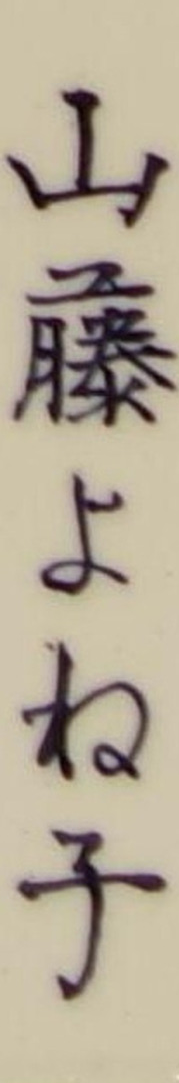山藤よね子
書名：A~D
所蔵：koyasan kongobuji
